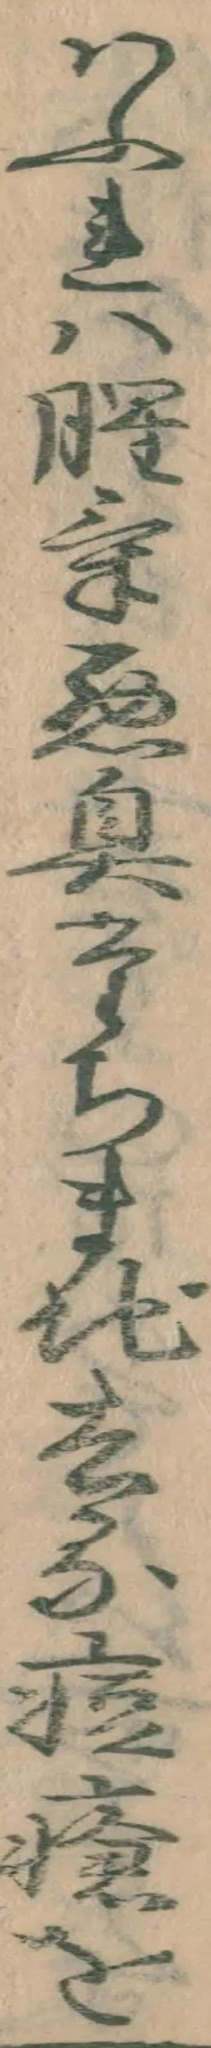はふれは腥気悪臭たちまち去る疱瘡を
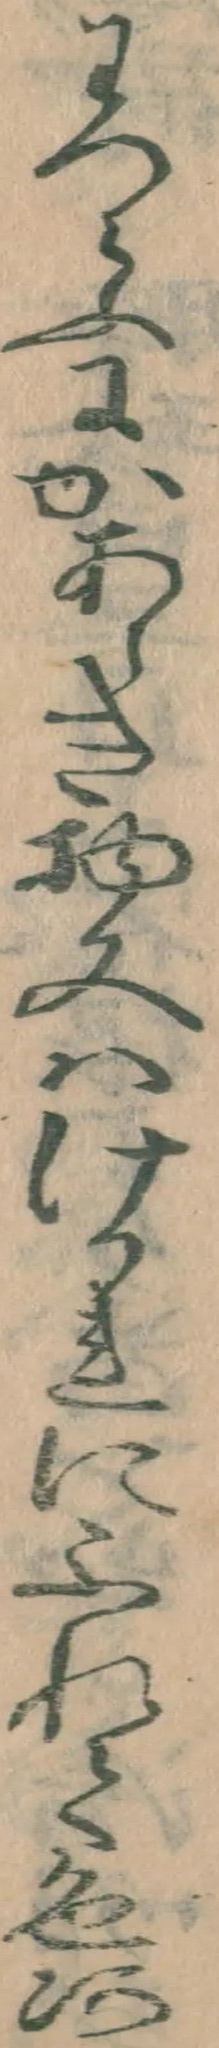わつらふにかあしき物又はけかれにふれて色あ
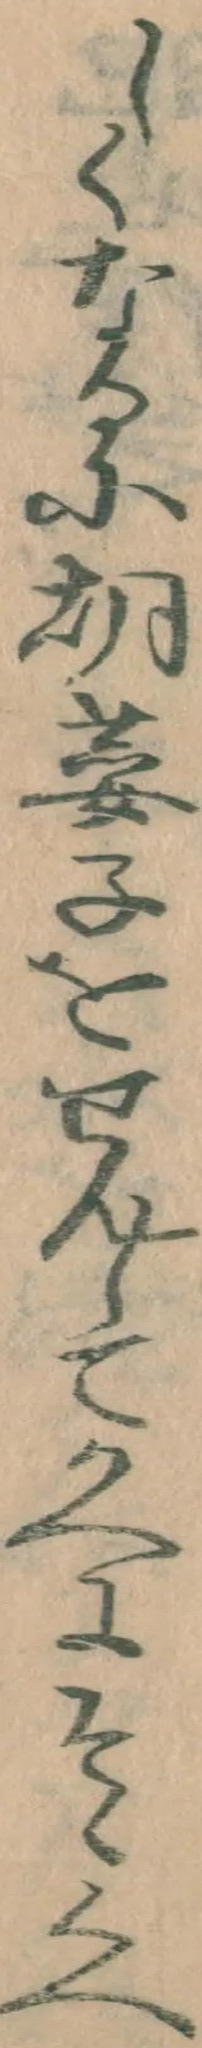しくなるに胡荽子をせんしてかへにそゝくへ
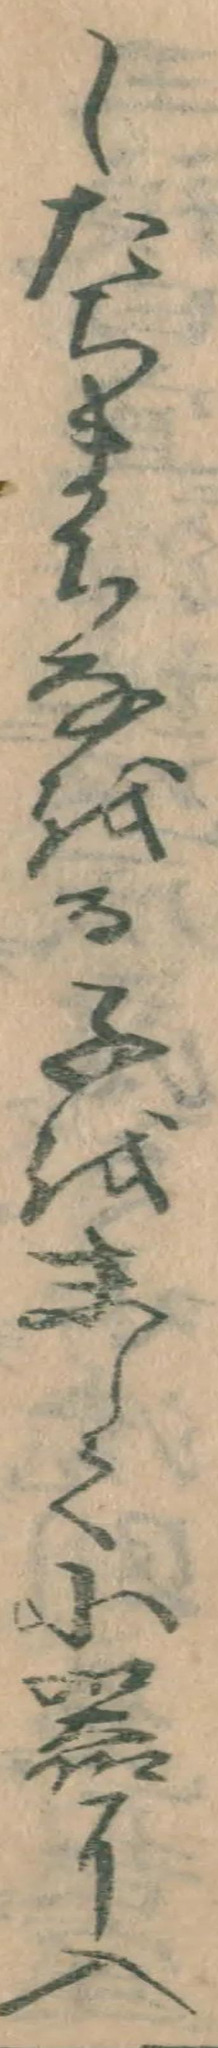したちまちなをる子を末して小器に入
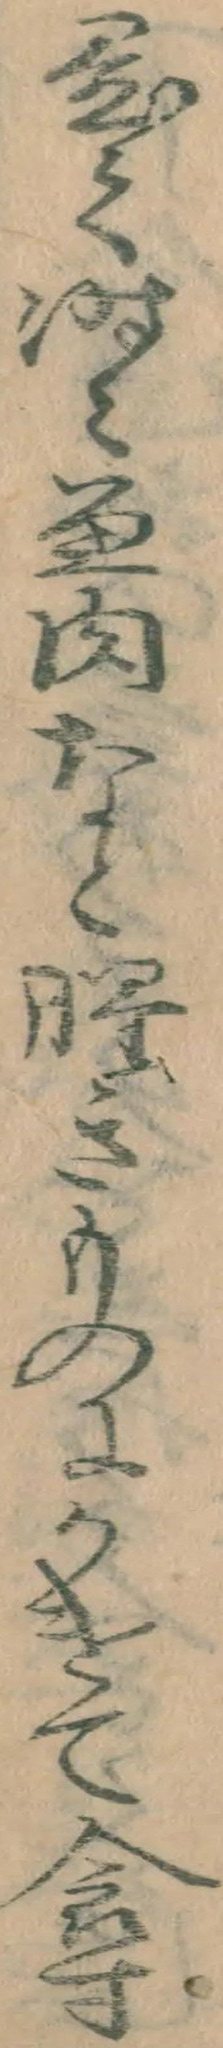置て時々魚肉なと腥きものにかけて食す

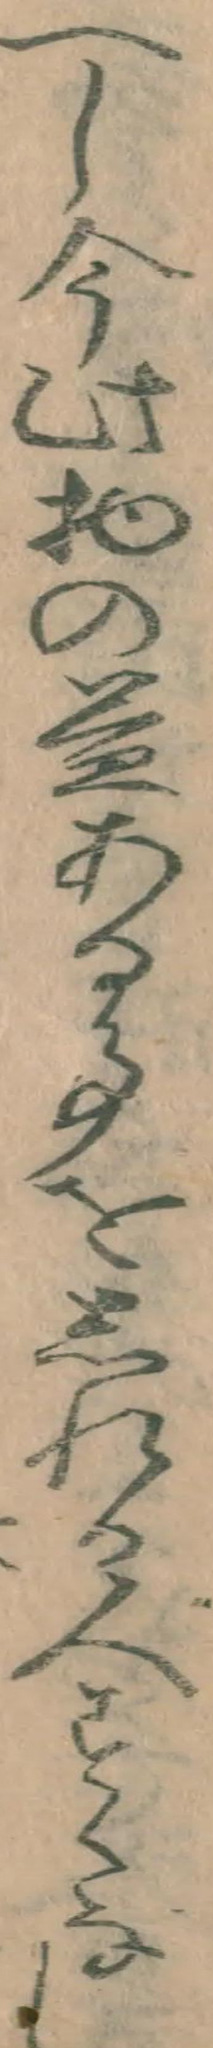へし今此物の益ある事をしれる人すくなし
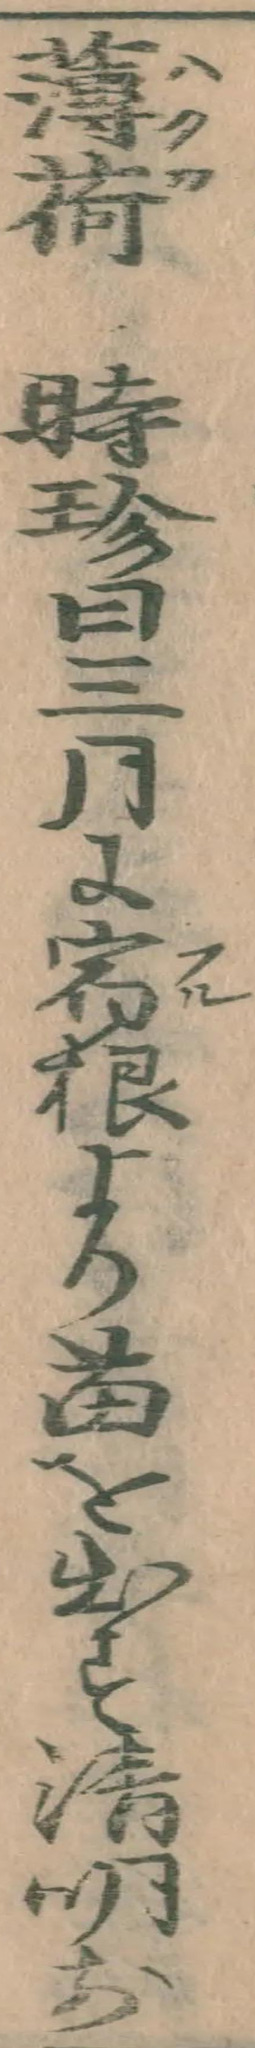薄荷時珍曰三月に宿根より苗を出す清明前
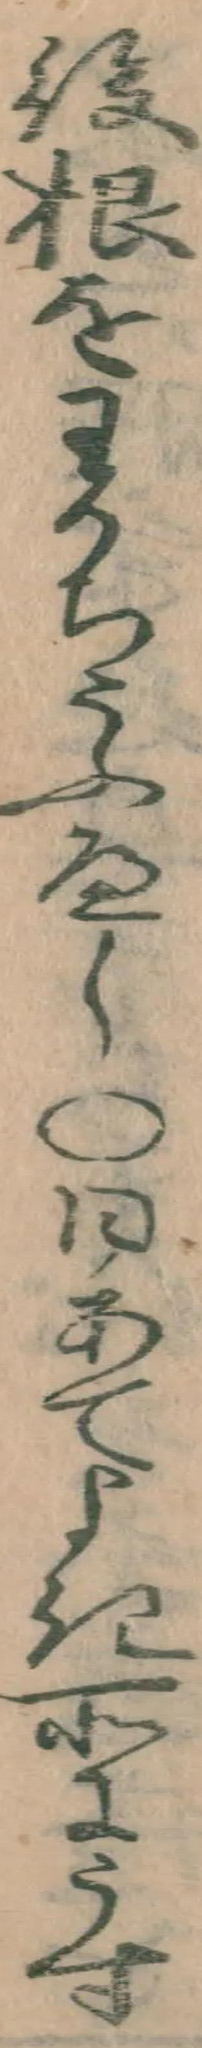後根をわかちうふへし〇日あてよき所にうす
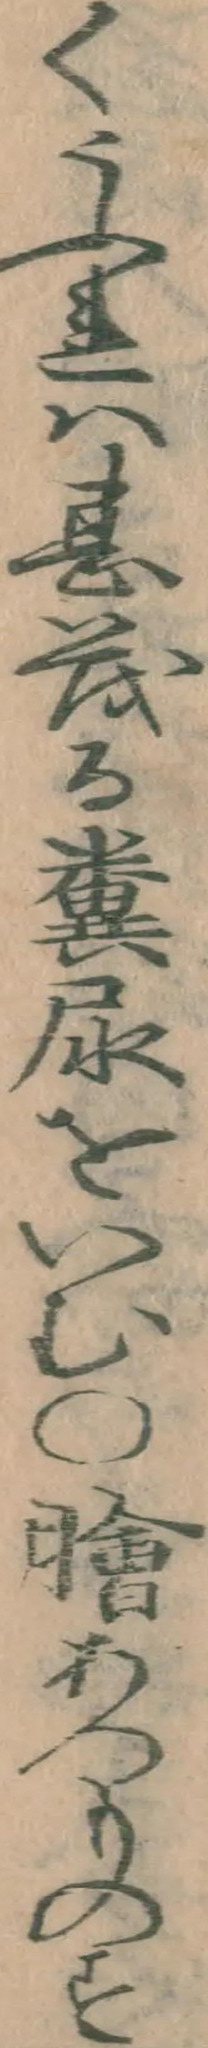くうふれは甚茂る糞尿をいむ〇膾あつものす
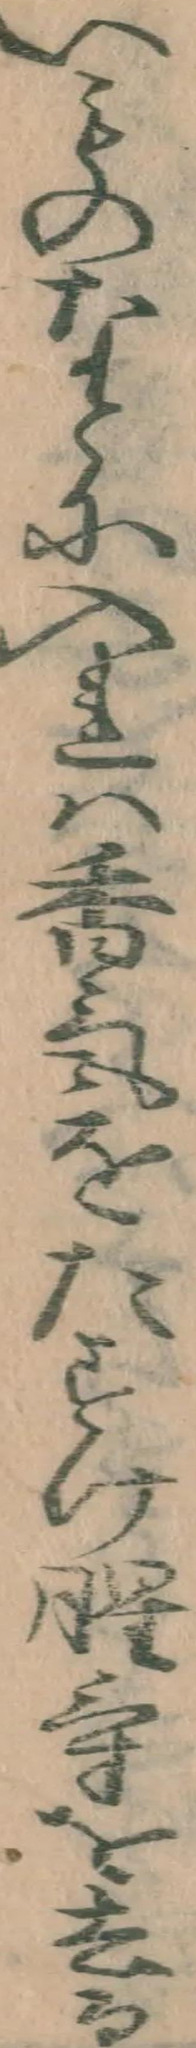いものなとに入れは香気をたすけ腥気を去る
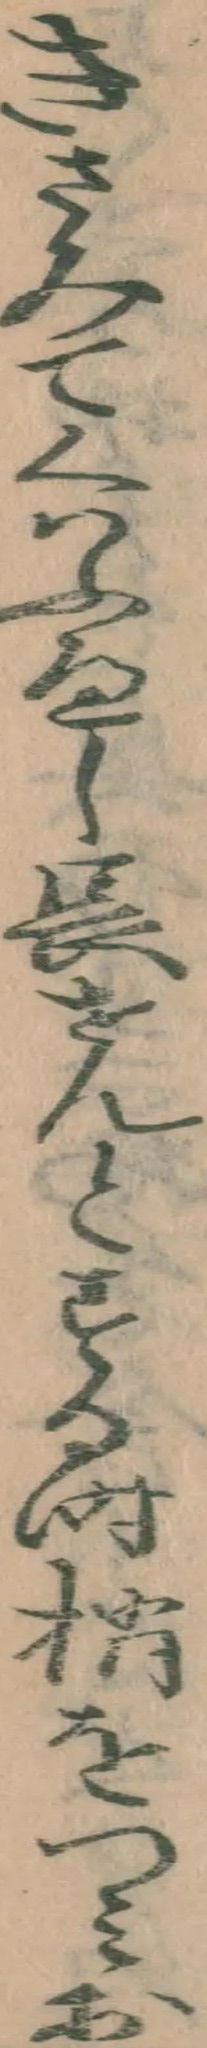きさみてくはふへし長せんとする時梢をつみお
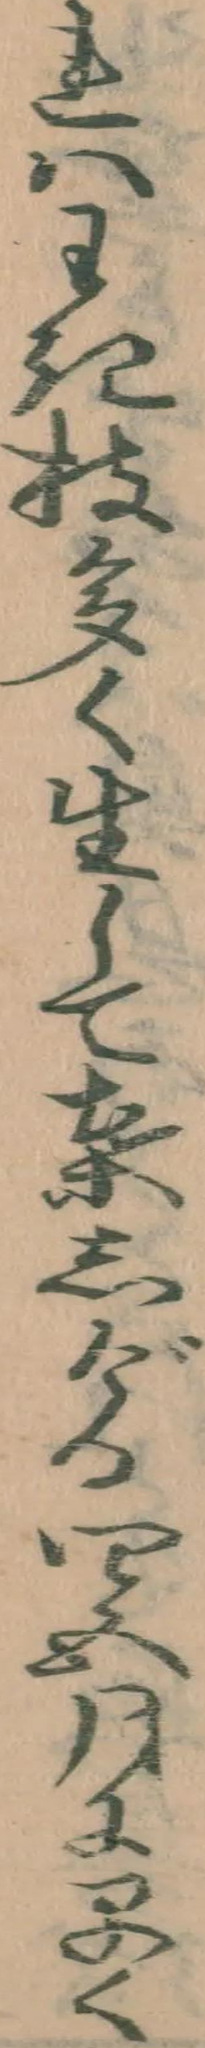れはわき枝多く生して葉しげる四五月に早く
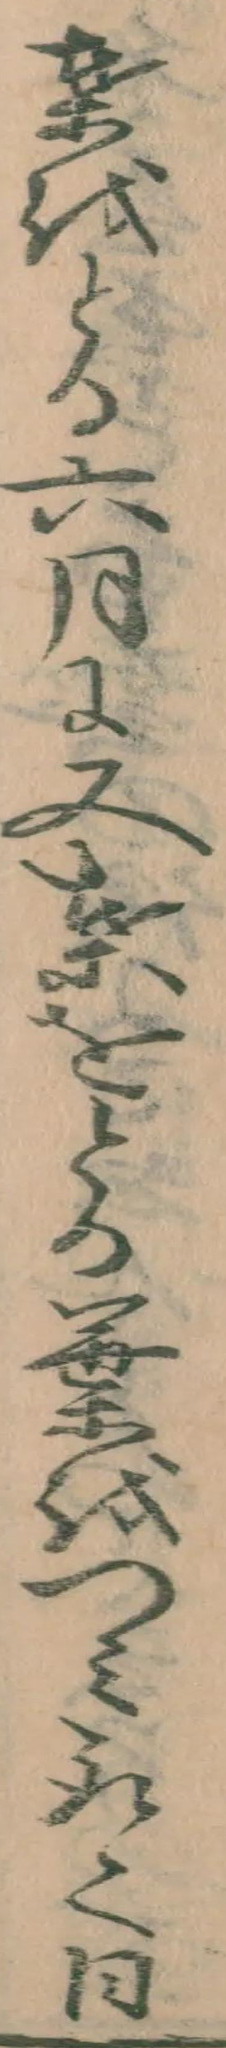葉をとる六月に又葉をとる葉をつみ取て日
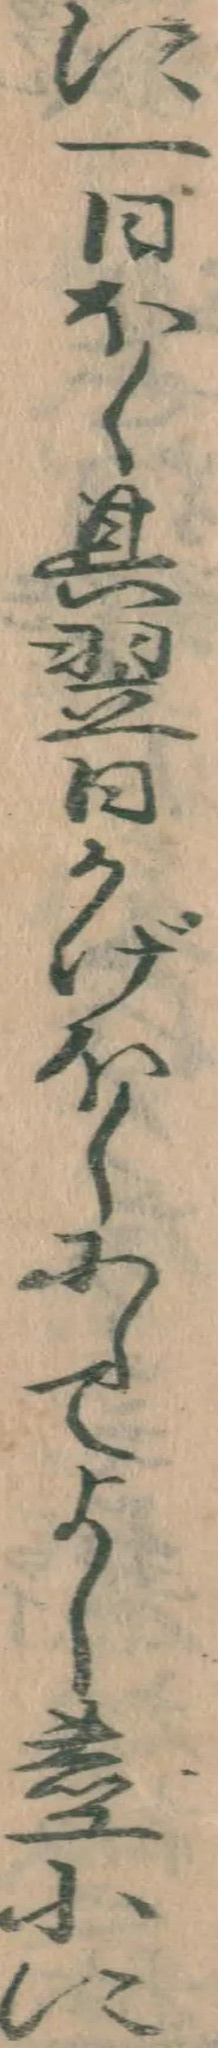に一日ほし其翌日かげほしにしてよし茎小に
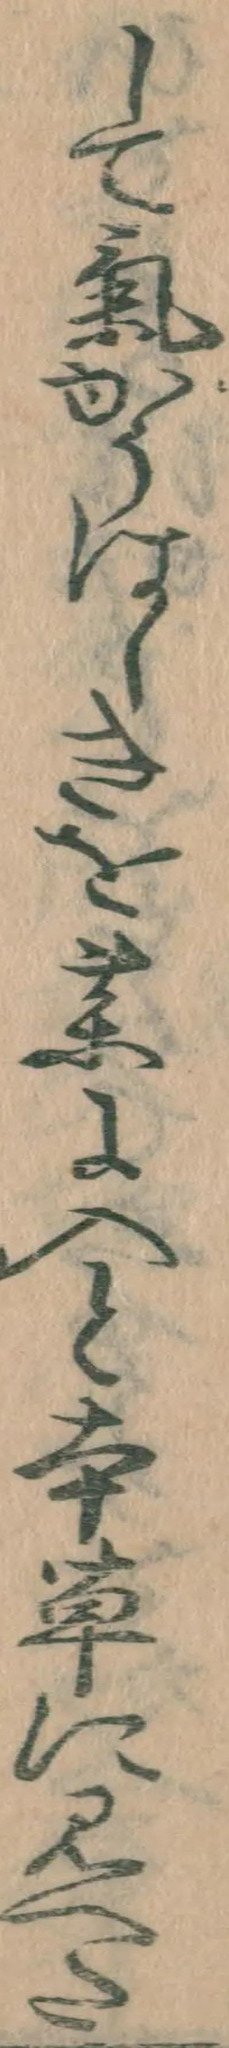して気かうはしきを薬に入と本草に見へた
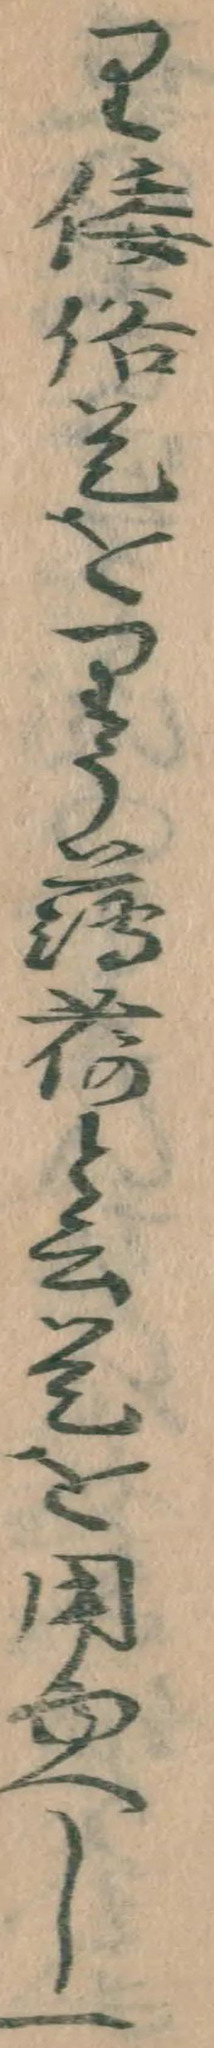り倭俗是をりう薄荷と云是を用ゆへし一
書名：菜譜 3巻
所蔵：国立国会図書館 National Diet Library, JAPAN
